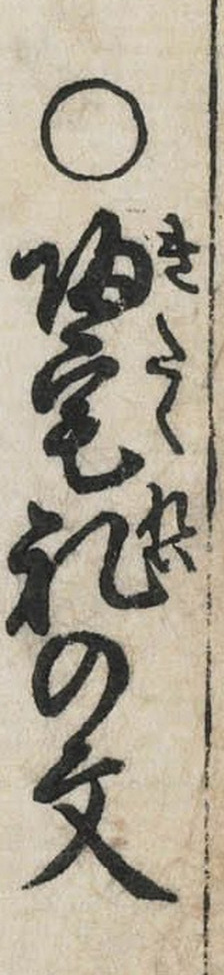○帰宅礼の文
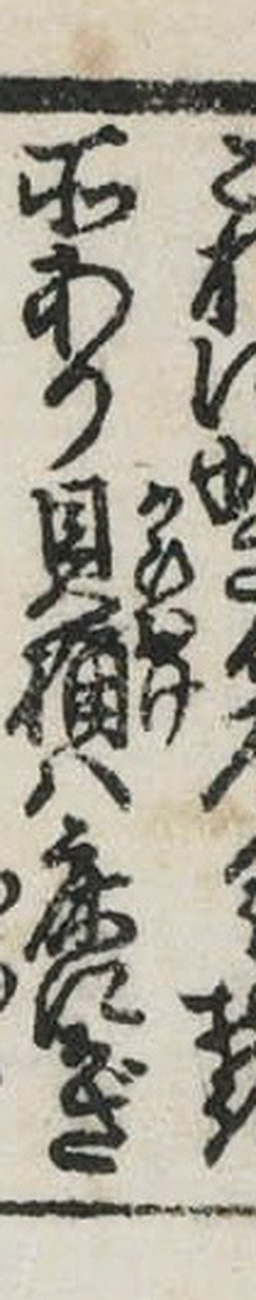所あり貝桶は床にかざ
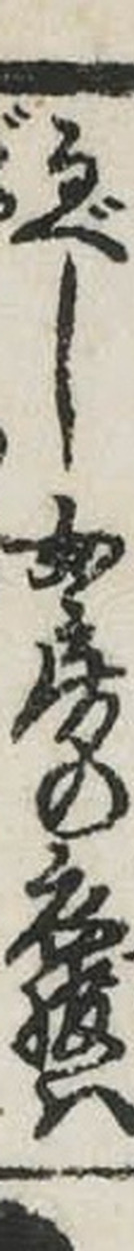るべし女房の衣服は
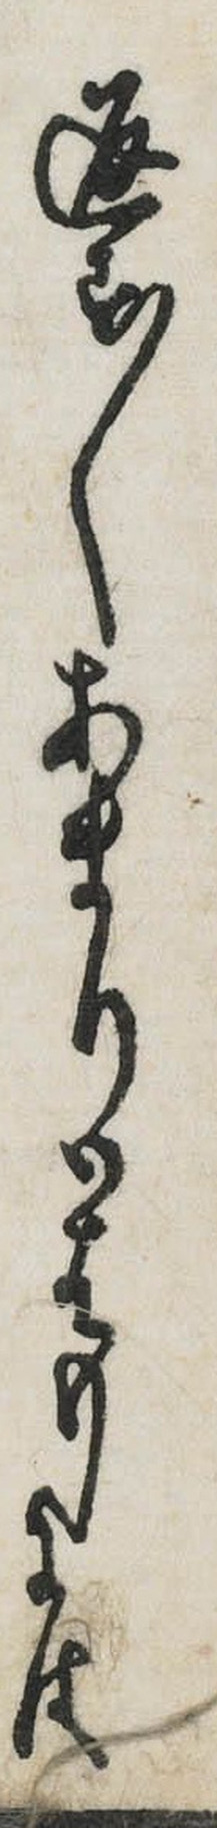返す〳〵あまり御はもしには
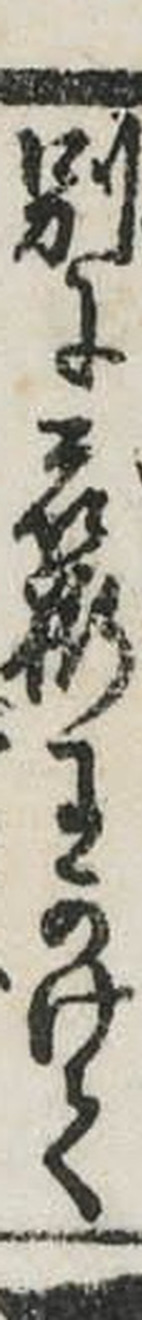別に衣桁にかけて
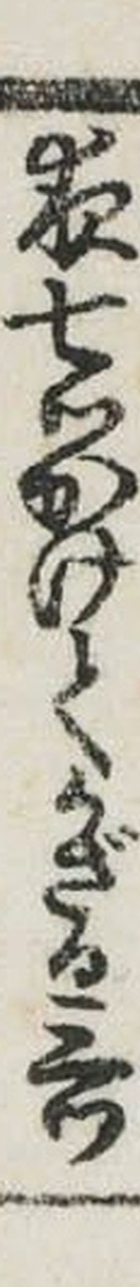夜七ツかけてかざる三ツ
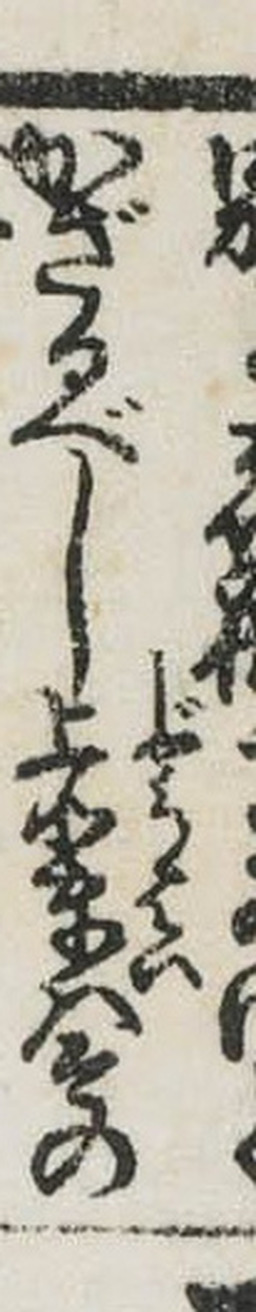かざるべし上輩はその
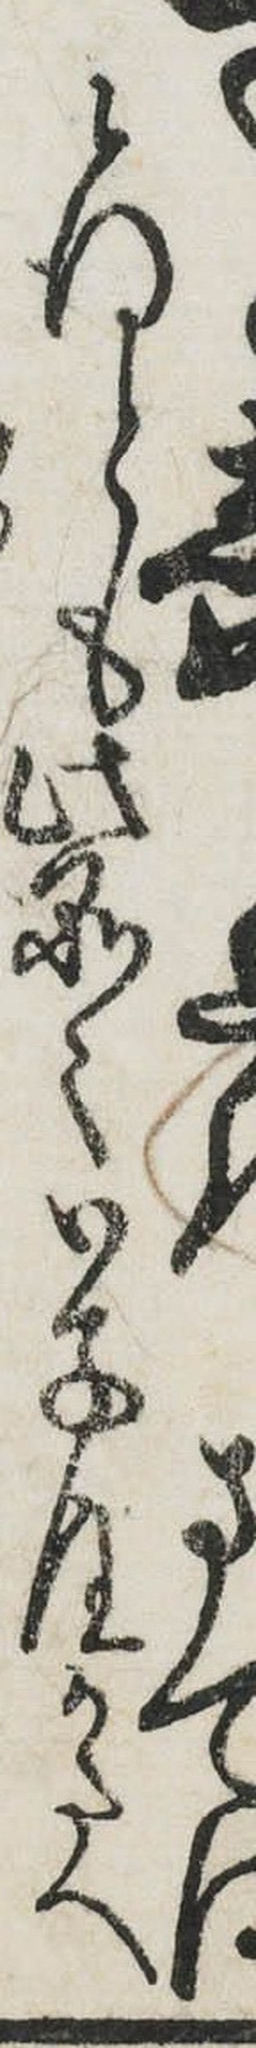候得とも此品々御子さまかたへ
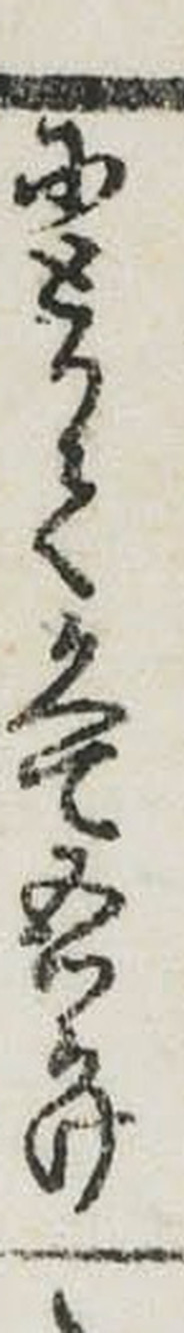にとりてかへて五ツかけ
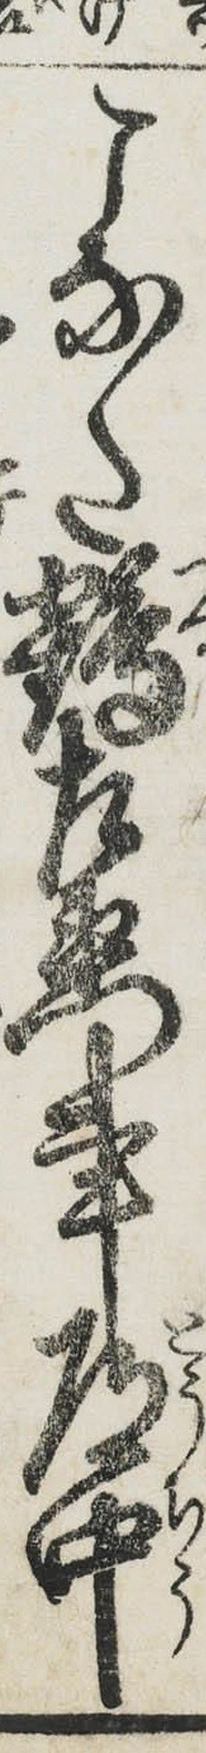こなた鶴左衛門事道中
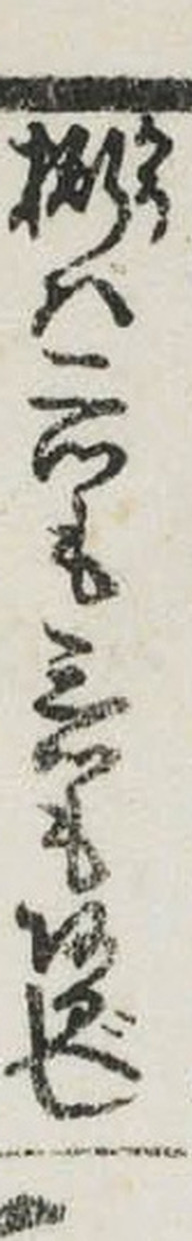桁は二ツも三ツもあるべし
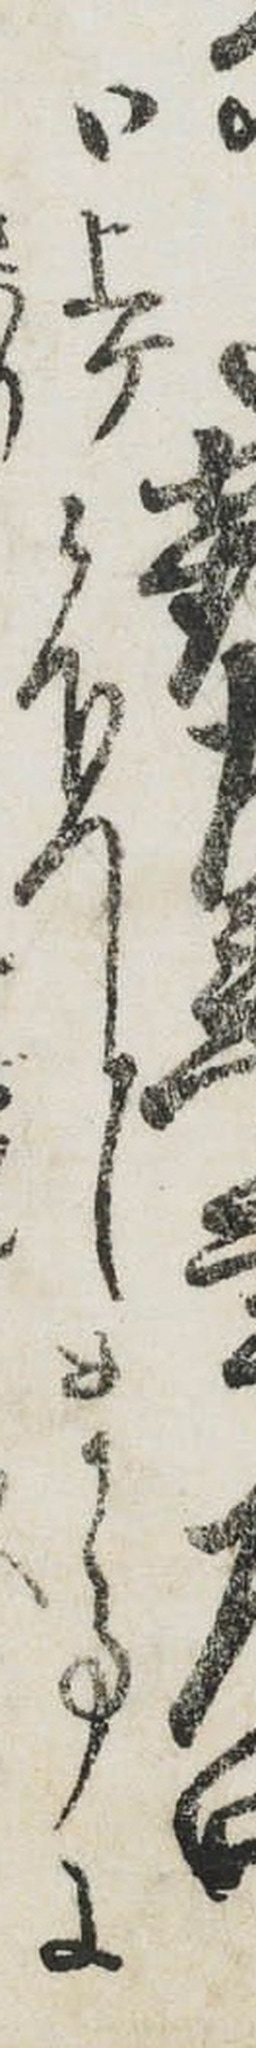御上ケ被下べく候ま事に
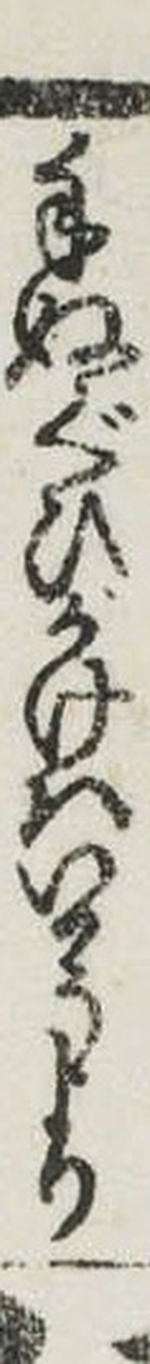手ぬぐひかけはいかうより
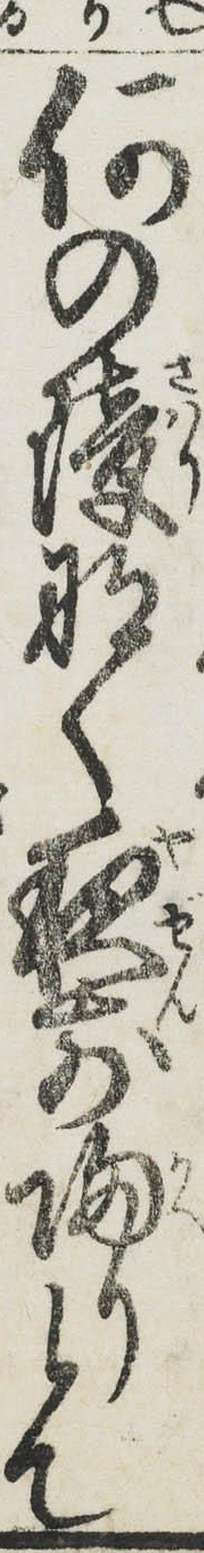何の障なく夜前帰り候て
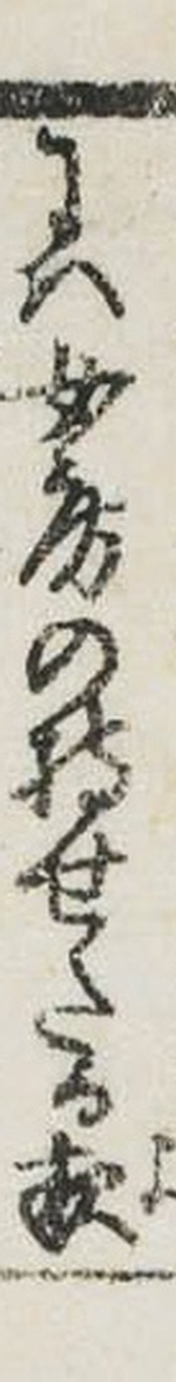には女房の持せたる夜
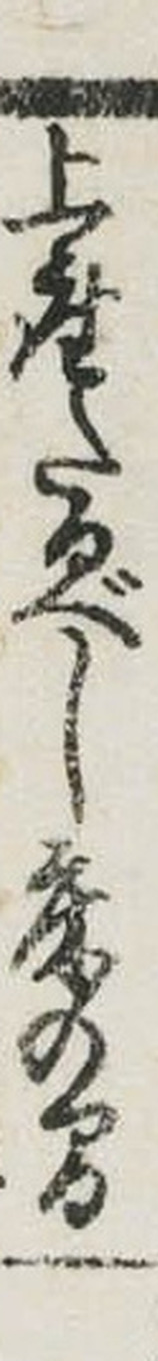上座たるべし床の間
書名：頭書萬用婦人手紙之文言
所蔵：東京学芸大学教育コンテンツアーカイブ
